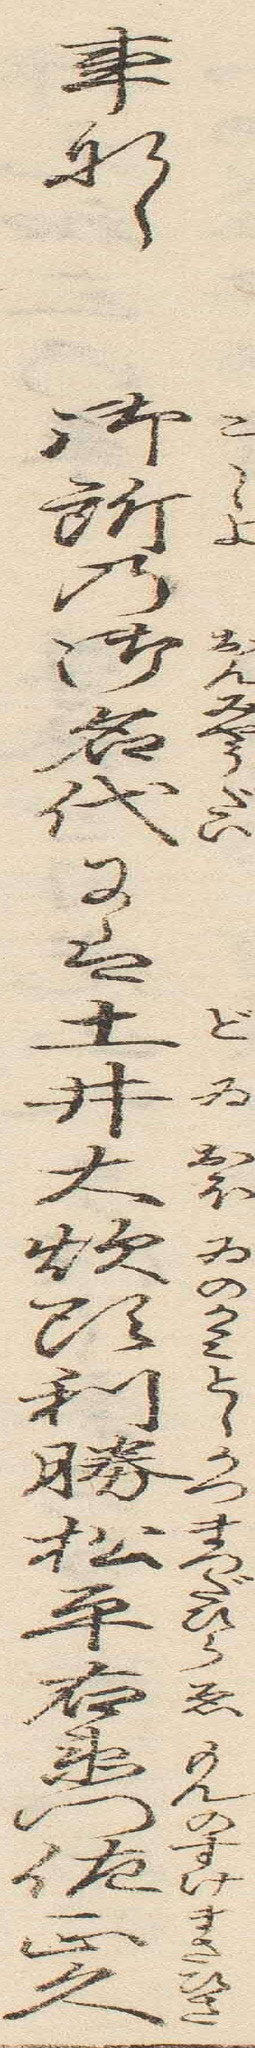事なし御所の御名代には土井大炊頭利勝松平右衛門佐正久
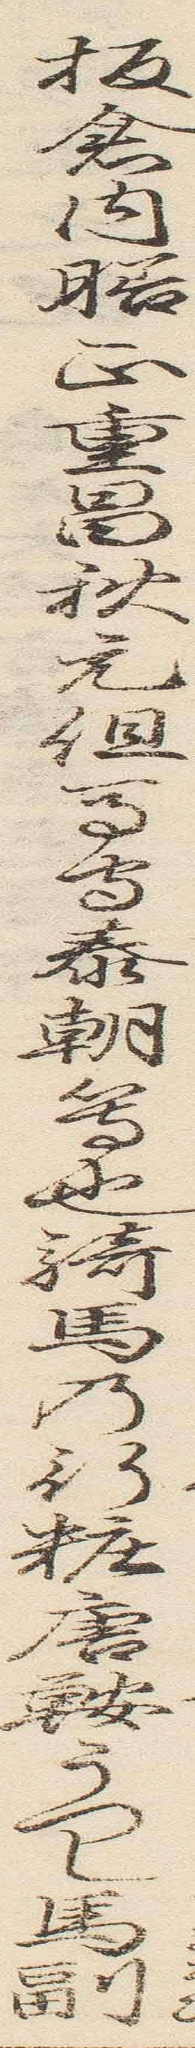板倉内膳正重昌秋元但馬守泰朝等也騎馬の行粧唐鞍うつし馬副
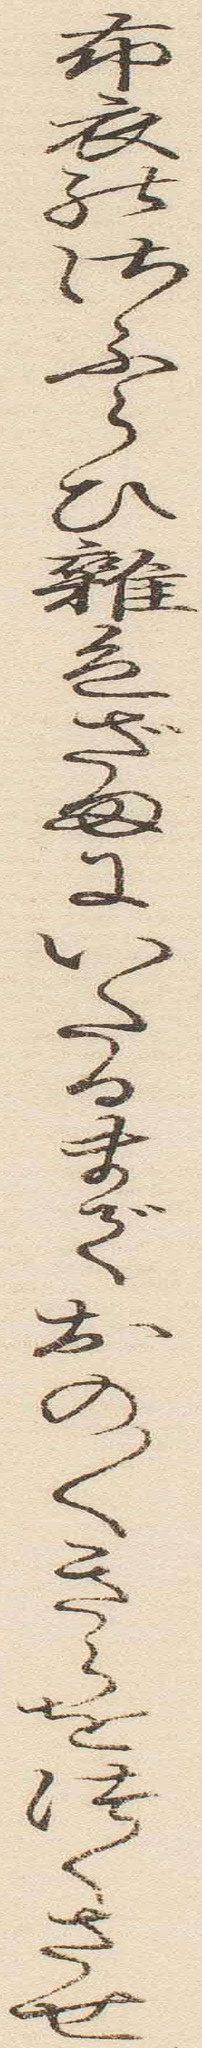布衣のさふらひ雜色ざまにいたるまでおの〳〵きらをつくさせ
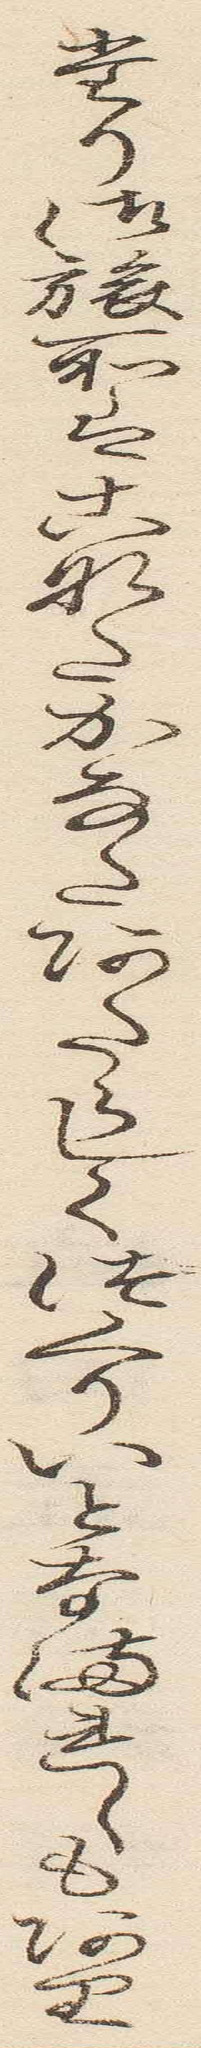たり御旅所はこなたかなたあたらしくつくりいとなまれしもあり
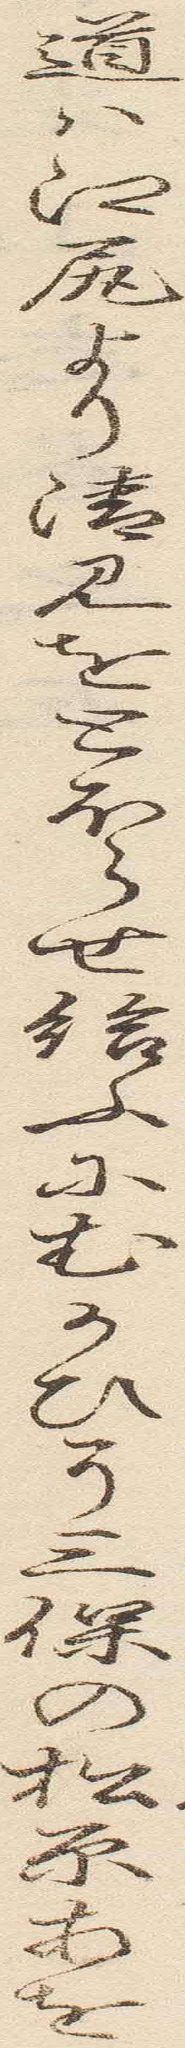道は江尻より清見をとほらせ給ふにむかひに三保の松原あを
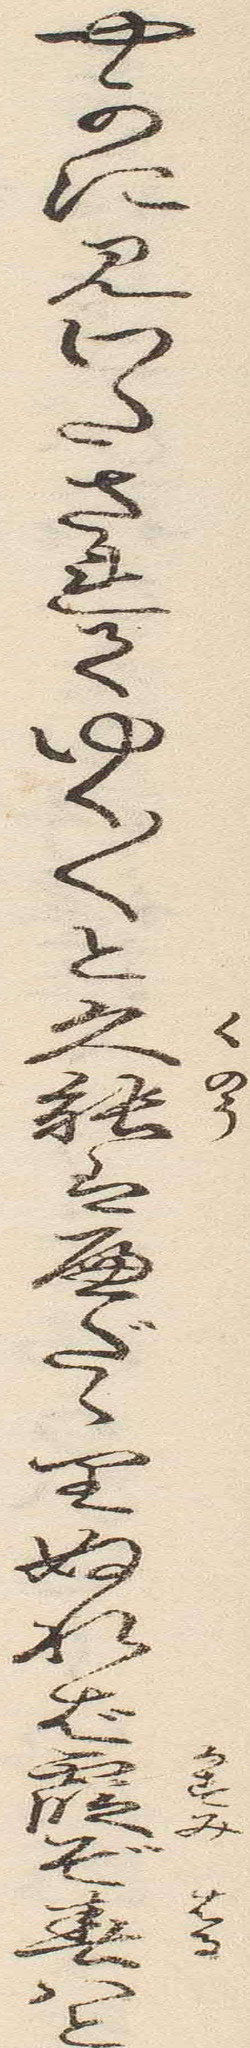やかに見わたされてゆく〳〵と久能はへだゝりぬれば霞ぞ春はと
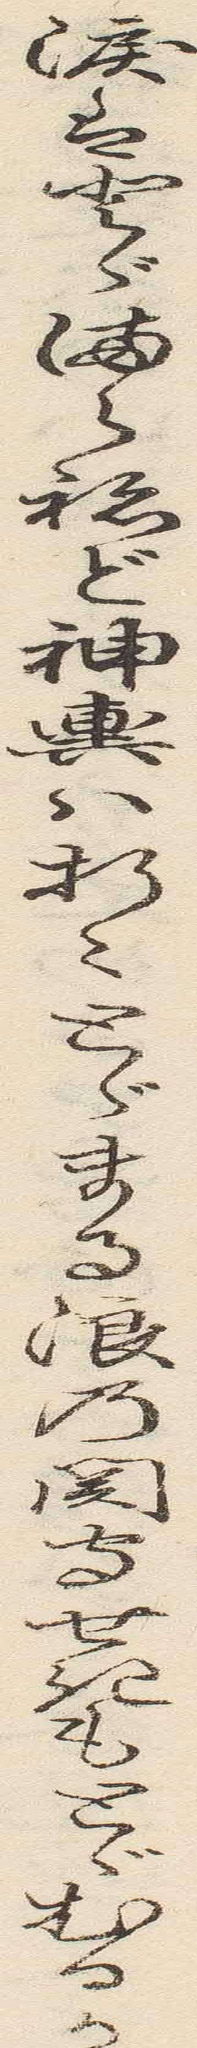涙はとゞまらねど神輿は折〻とゞまる浪の関守せきもとゞむるか
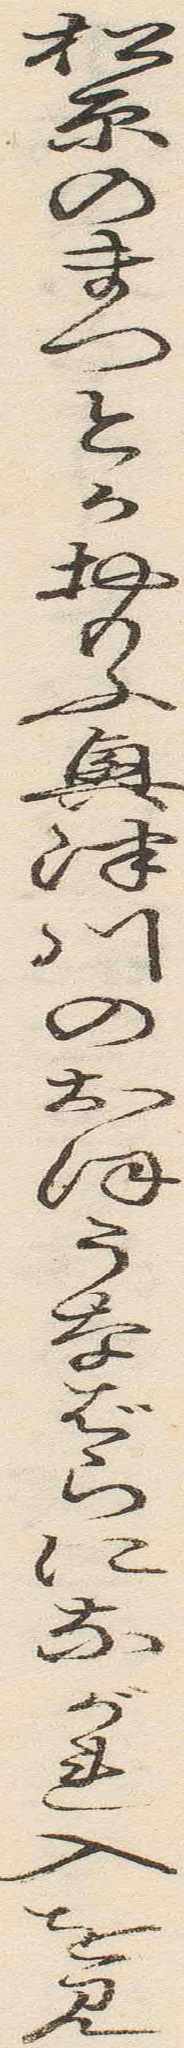松原のまつとかおもふ興津川のおほうなばらにながれ入を見
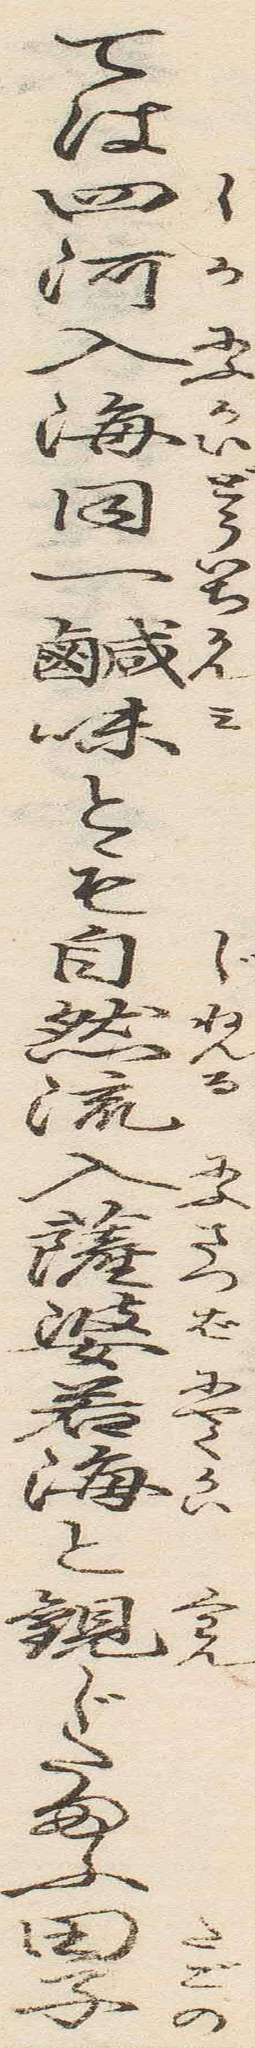ては四河入海同一鹹味とも自然流入薩婆若海と觀じたまふ田子
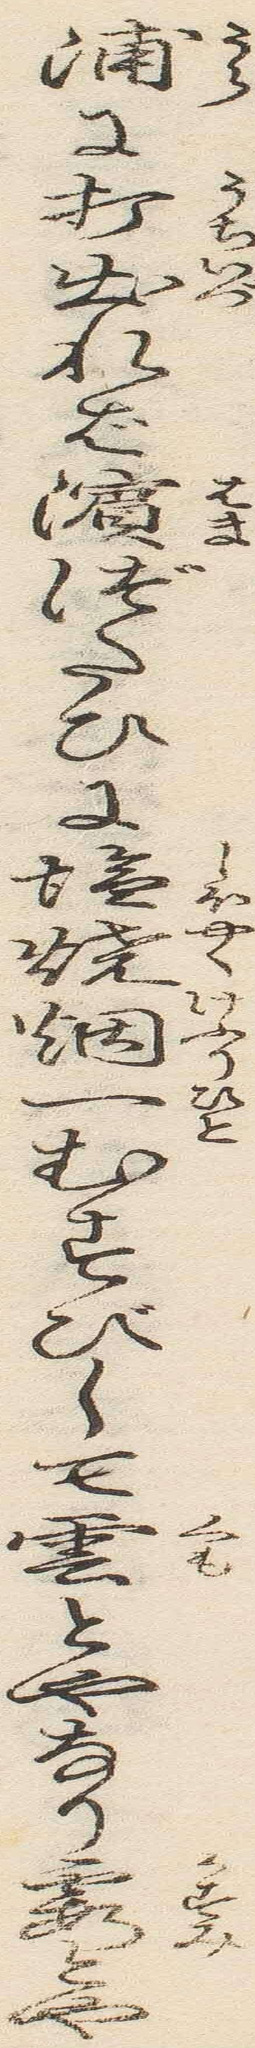浦に打出れば濵づたひに塩焼烟一むすびして雲とやなり霞とや
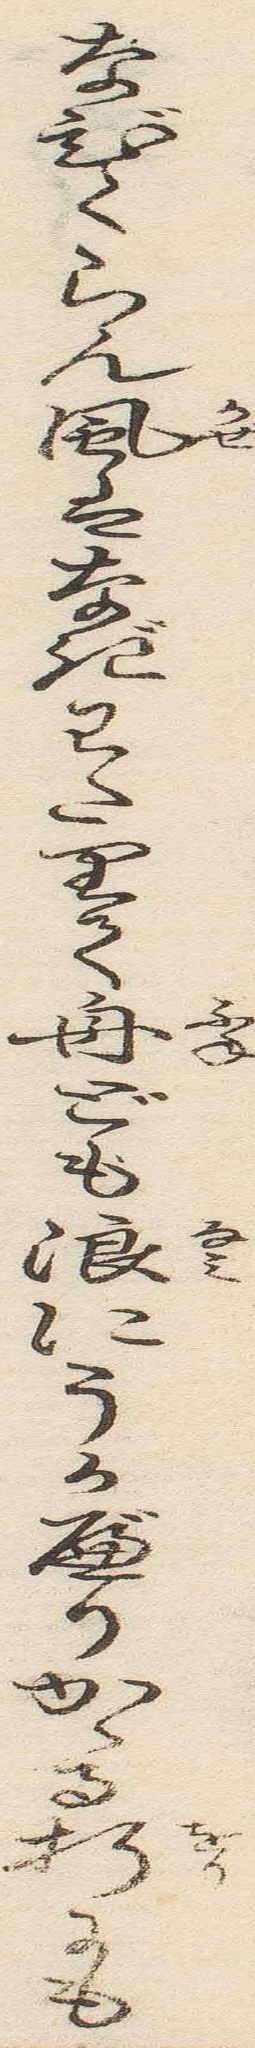なびくらん風はなぎわたりて舟ども浪にうかべりかゝる折にも
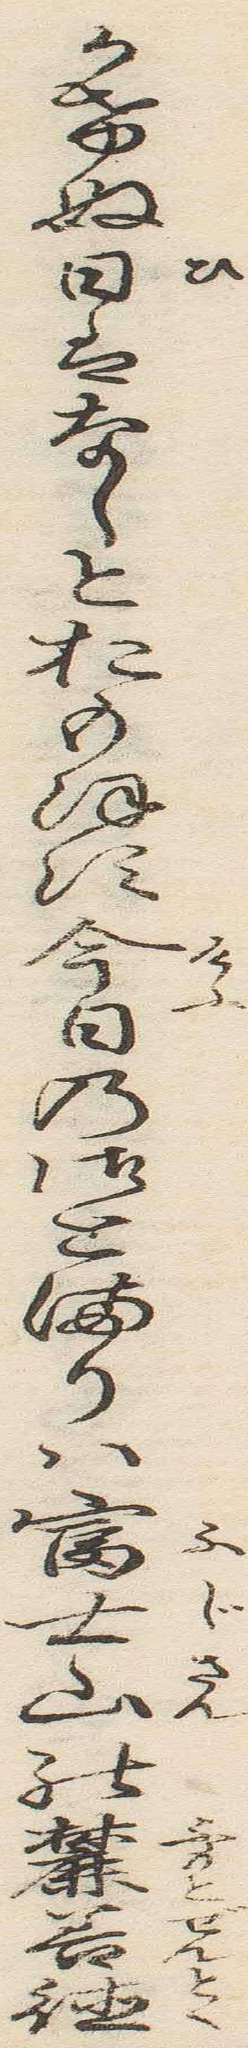かけぬ日はなしとおもほす今日の御とまりは富士山の麓善徳
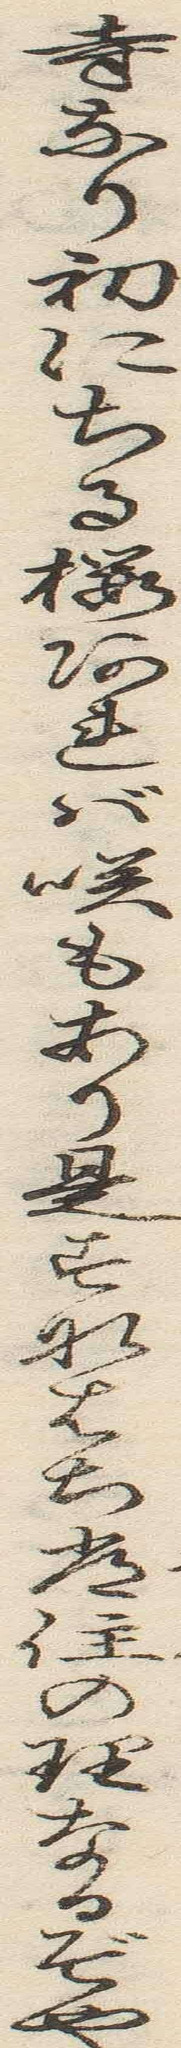寺なり初にちる桜あれば咲もあり是すなはち常住の理なるぞや
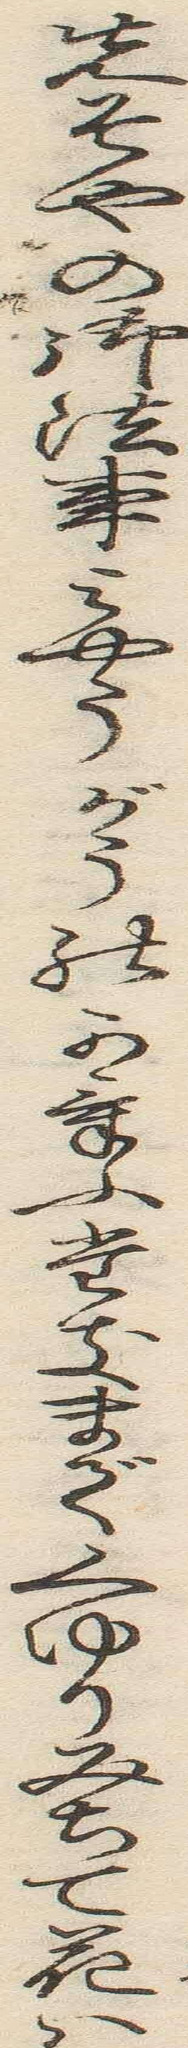先そやの御法事みやうがうのかゝ気ふたきまでくゆりみちて花は
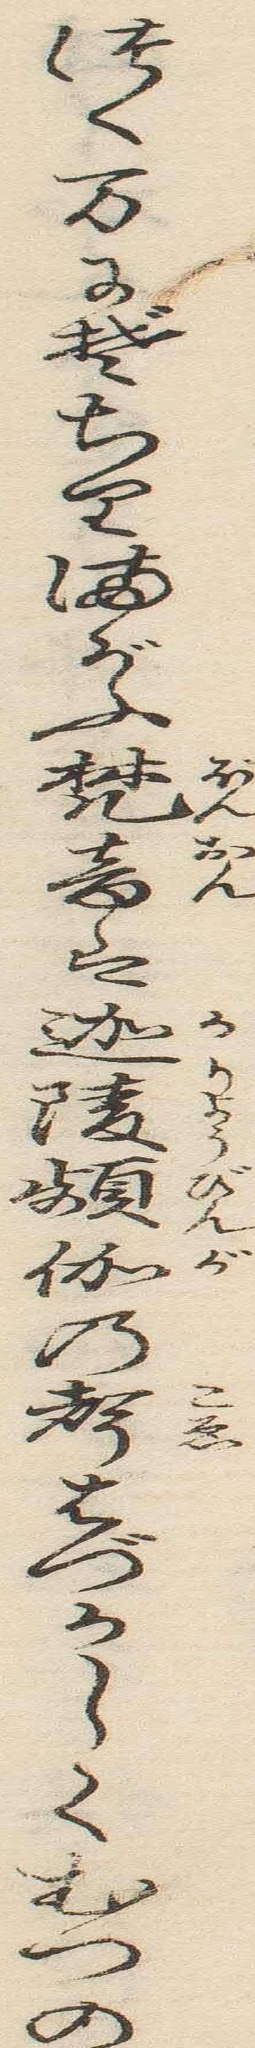つくまにぞちりまがふ梵音は迦陵頻伽の聲はづかしくむつの
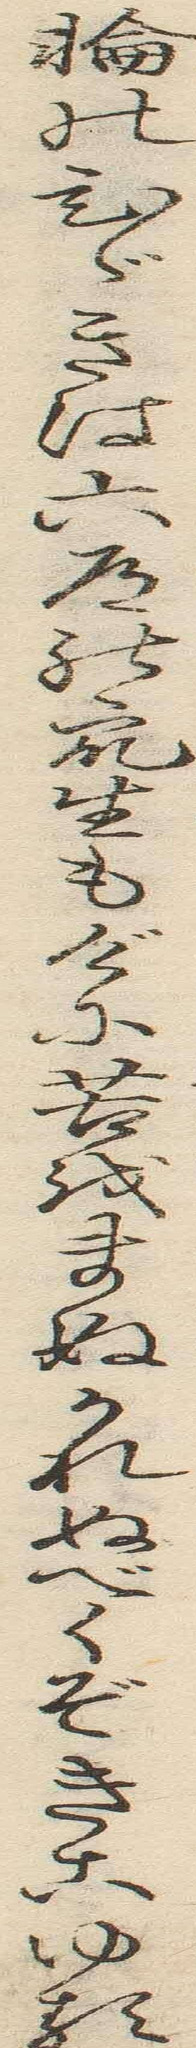輪のひゞきは六道の衆生もげに苦をまぬかれぬべくぞきこゆる
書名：日光山志
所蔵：東京学芸大学附属図書館 国文学研究資料館
